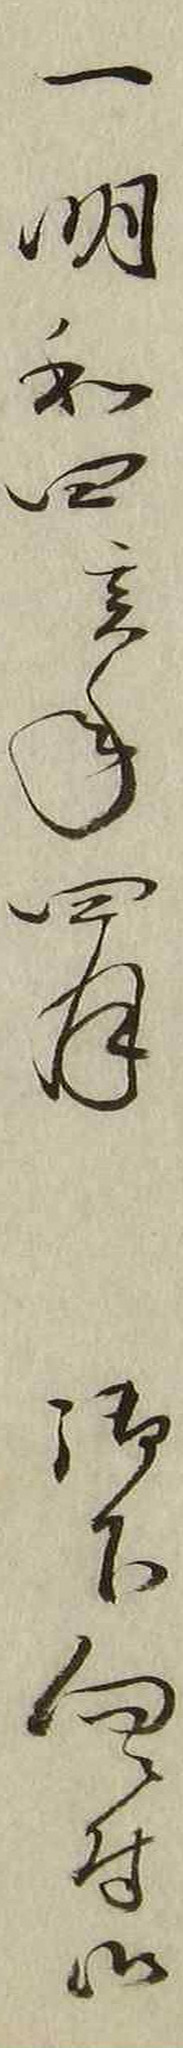一明和四亥年四月御下向ニ付御
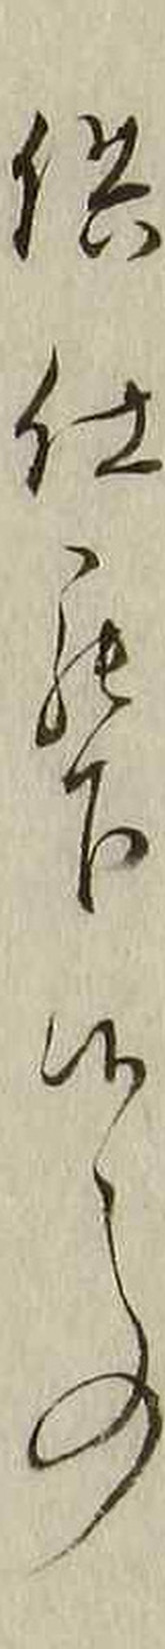供仕被下置候事
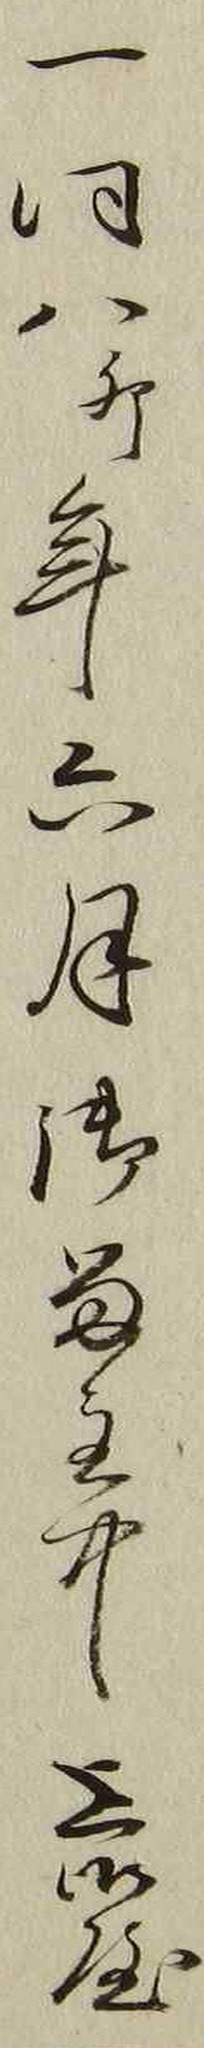一同八卯年六月御留守中上屋
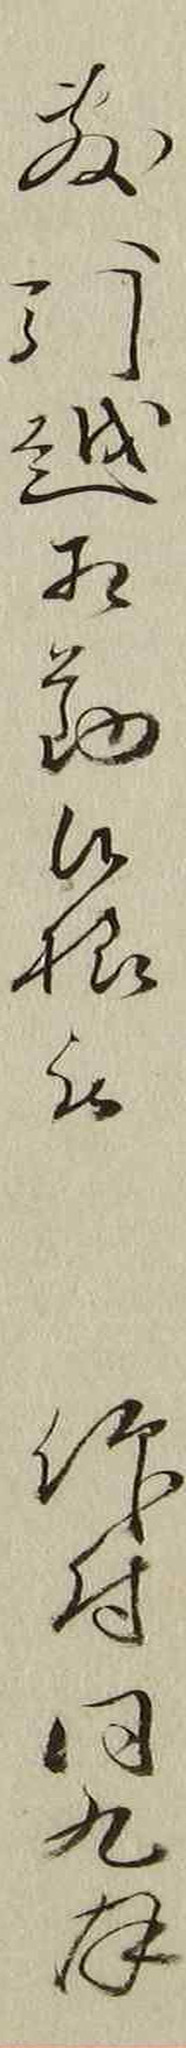敷へ引越相勤候様被仰付同九月
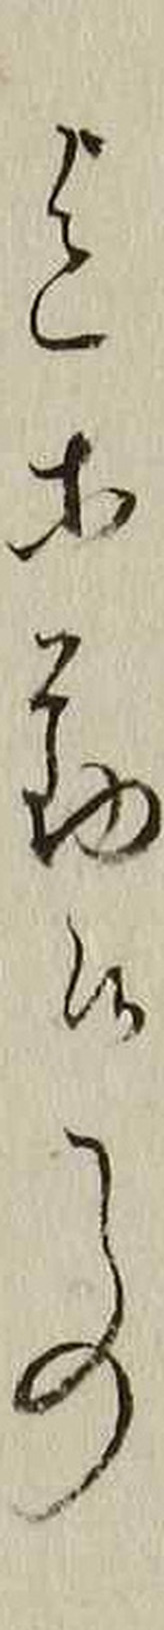迄相勤候事
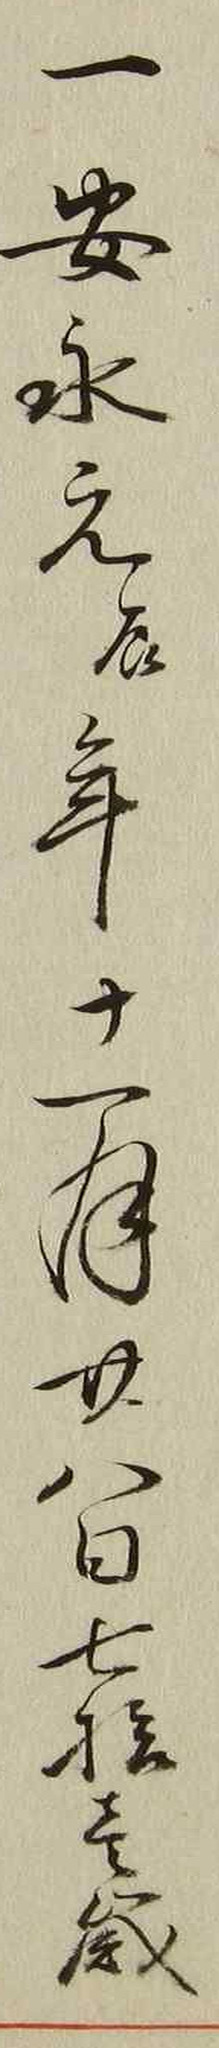一安永元辰年十一月廿八日七拾壱歳
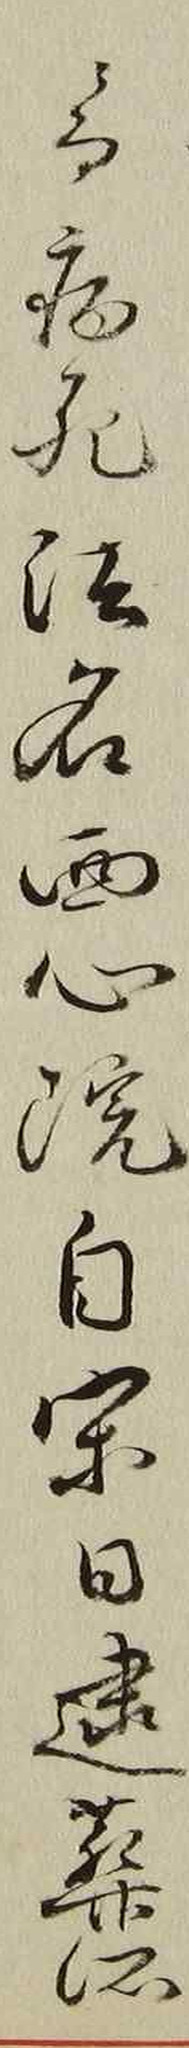ニ而病死法名西心院自閑日逮葬所
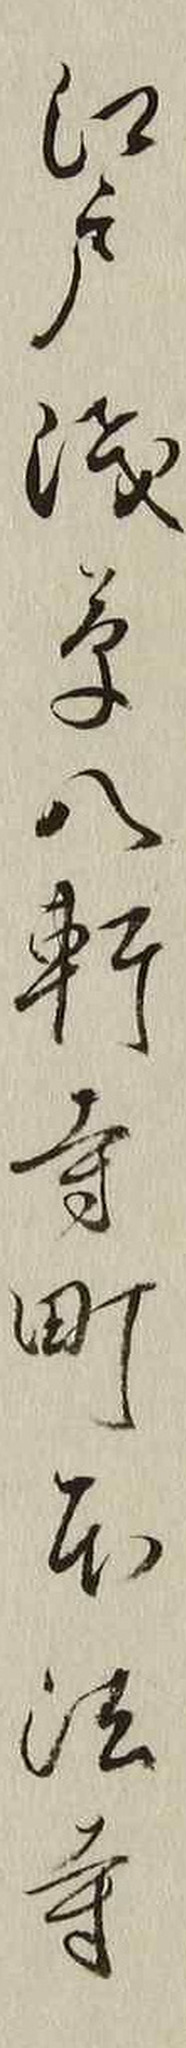江戸浅草八軒寺町本法寺
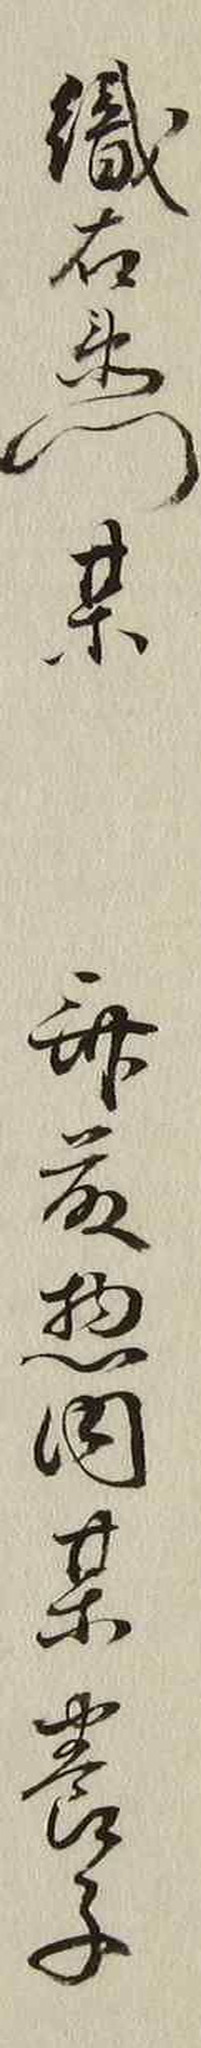織右衛門某斎藤惣内某養子
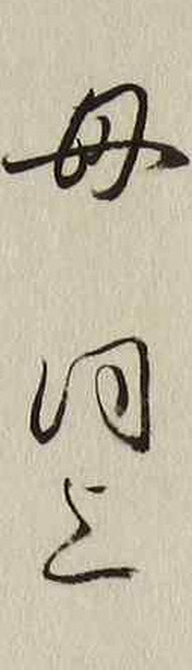母同上
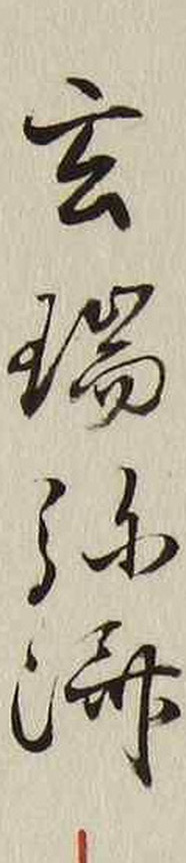玄瑞弥済
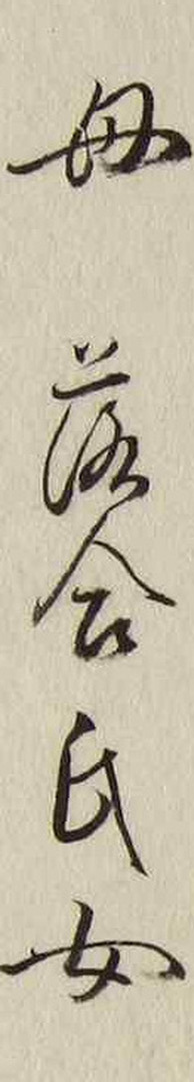母落合氏女

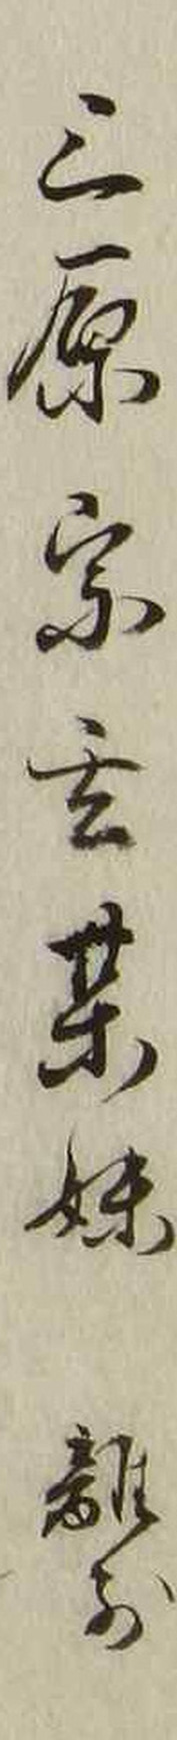妻三原宗玄某妹離別
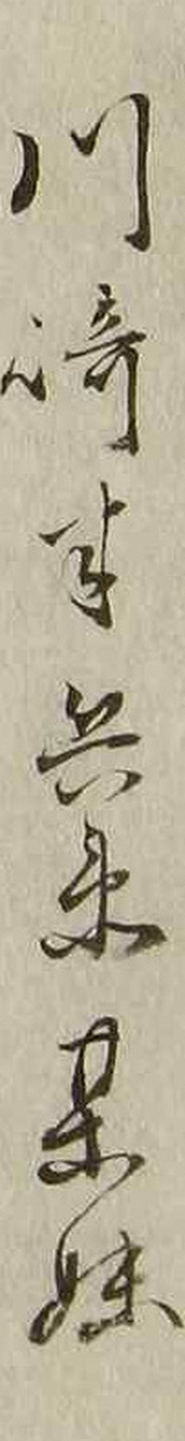川崎半兵衛某妹
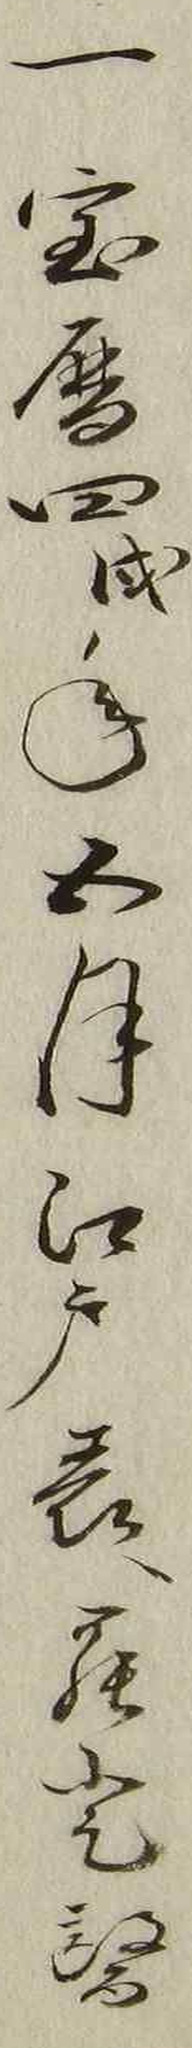一宝暦四戌年五月江戸表へ罷登医
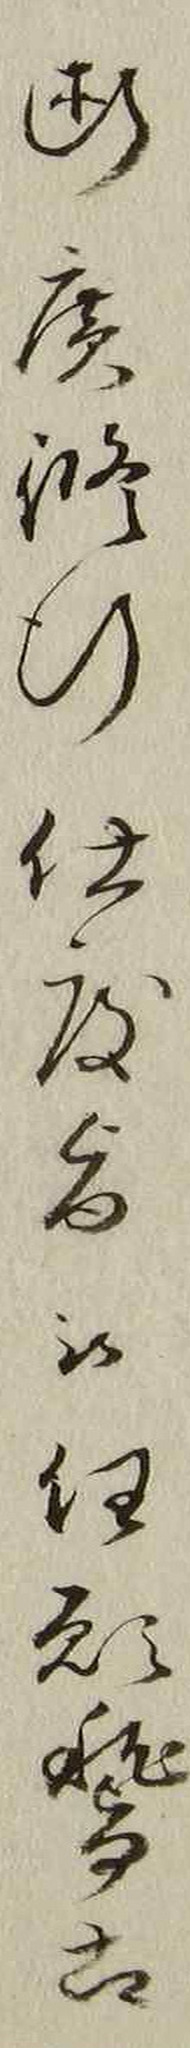断広修行仕度旨被任願稽古
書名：諸士系譜　巻之8　い之部8
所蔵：会津若松市立会津図書館
